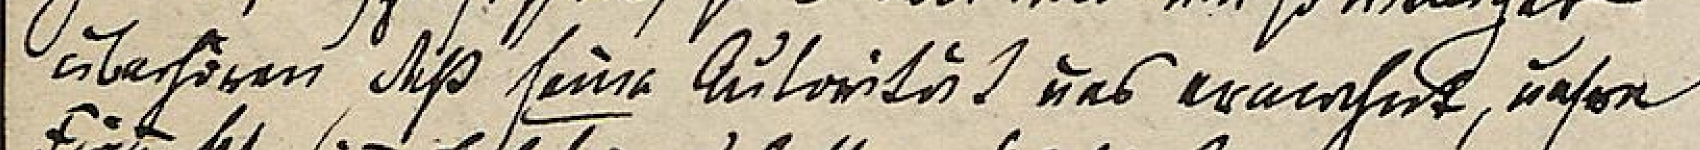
überhören, daß seine Autorität uns ermahnt, unsre
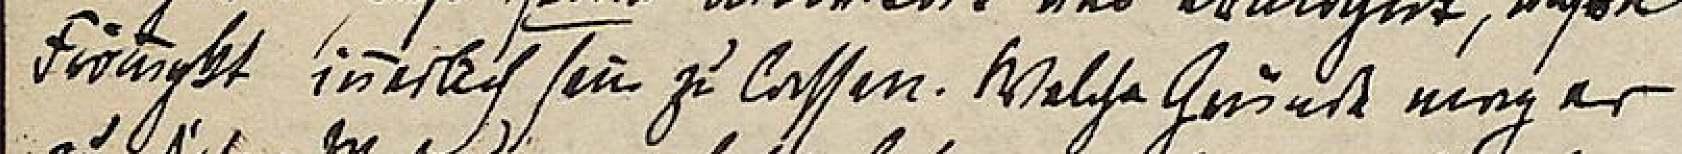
Frömigkeit inerlich sein zu lassen. Welche Gründe mag er
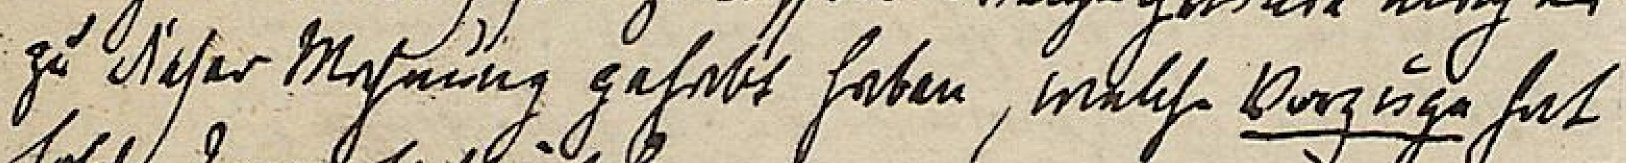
zu dieser Mahnung gehabt haben? welche Vorzüge hat
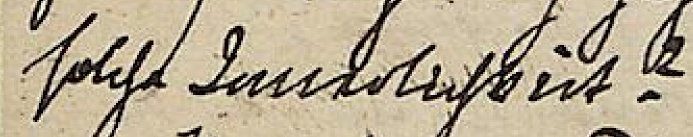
solche Innerlichkeit?
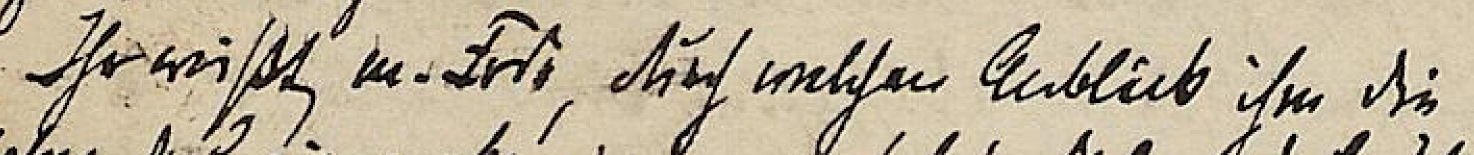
Ihr wißt, m. Frd., durch welchen Anblick ihm die
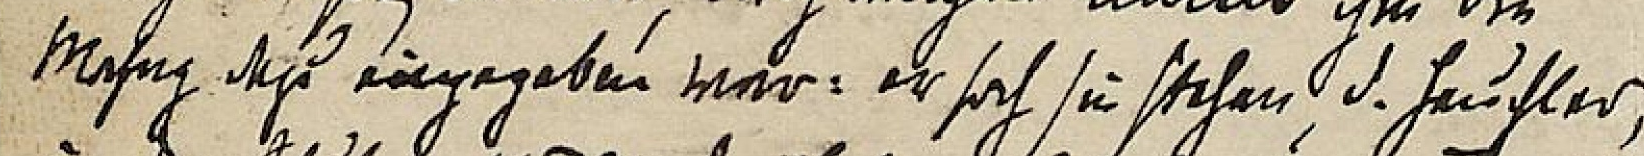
Mahng dazu eingegeben war: er sah sie stehen, d. Heuchler,
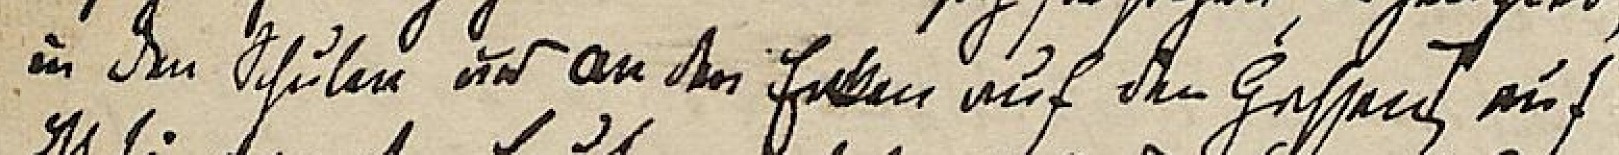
in den Schulen und an den Ecken auf den Gassen,] auf
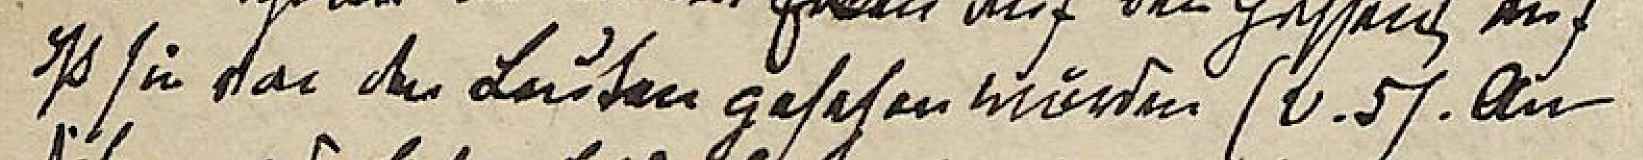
daß sie von den Leuten gesehen würden (V.5). An
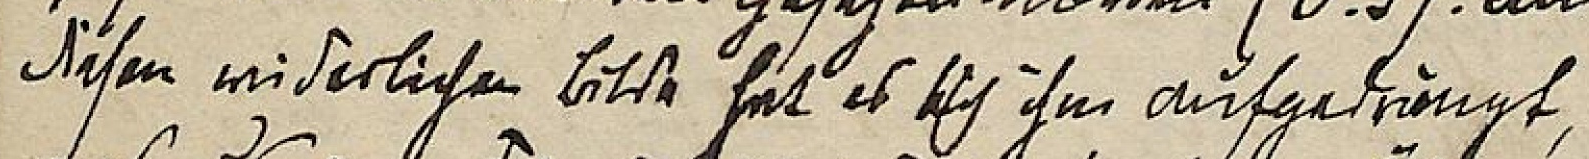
diesem widerlichen Bilde hat es sich ihm aufgedrängt,
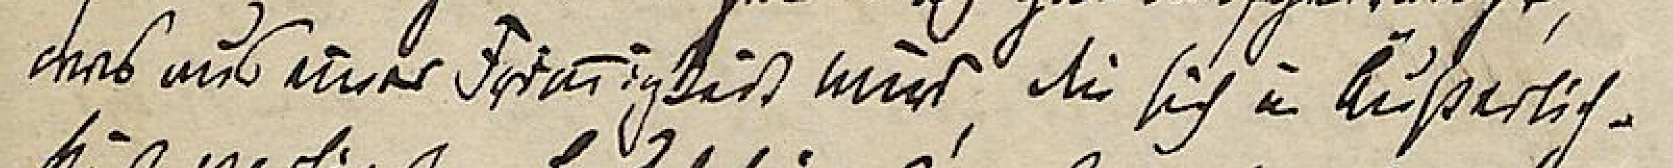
was aus einer Frömigkeit wird, die sich in Äußerlich¬
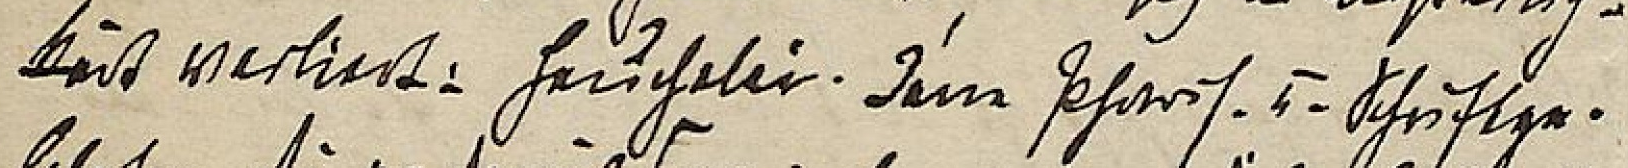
keit verliert: Heuchelei. Jene Pharis. u. Schriftge¬
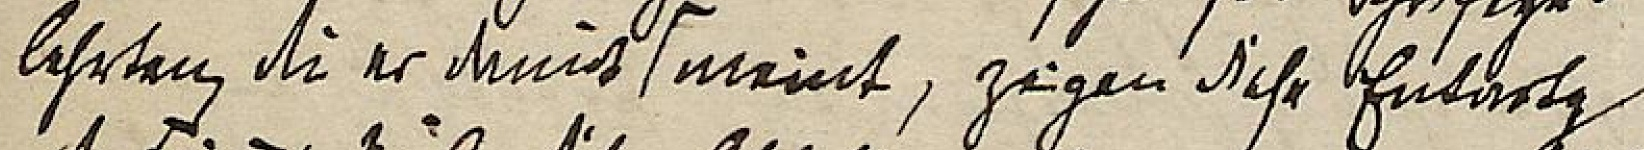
lehrten, dier damit [ meint, zeigen diese Entartg.
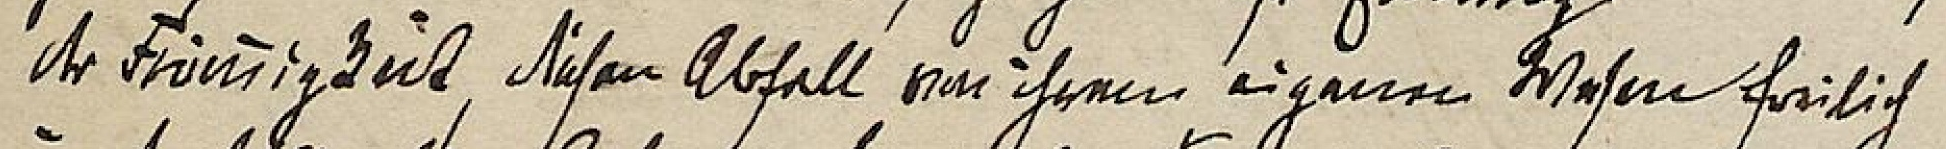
der Frömigkeit, diesen Abfall von ihrem eigenen Wesen freilich
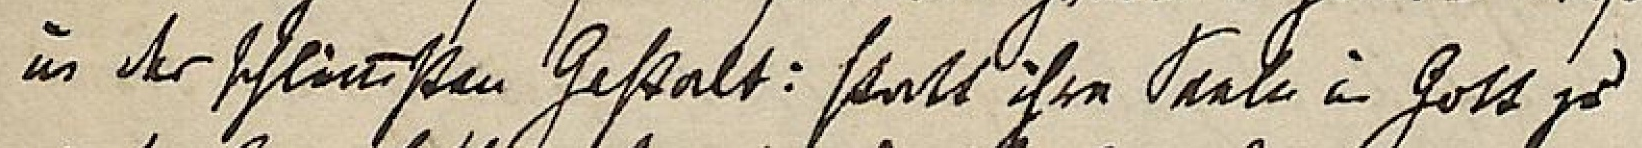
in der schlimsten Gestalt: statt ihre Seele in Gott zu
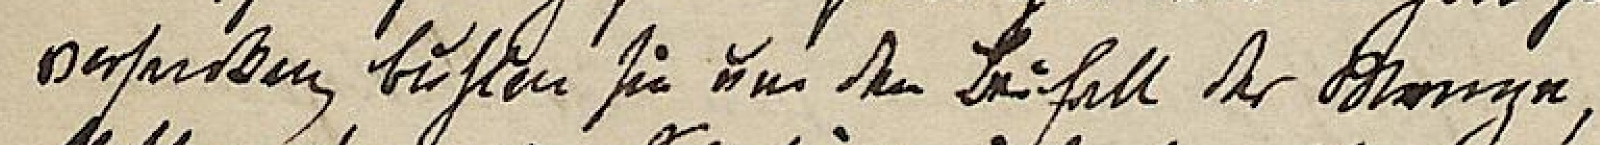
versenken, buhlen sie um den Beifall der Menge,
